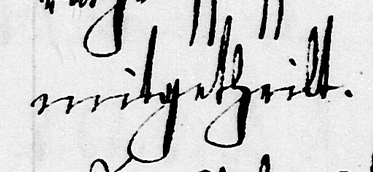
mitgetheilt.
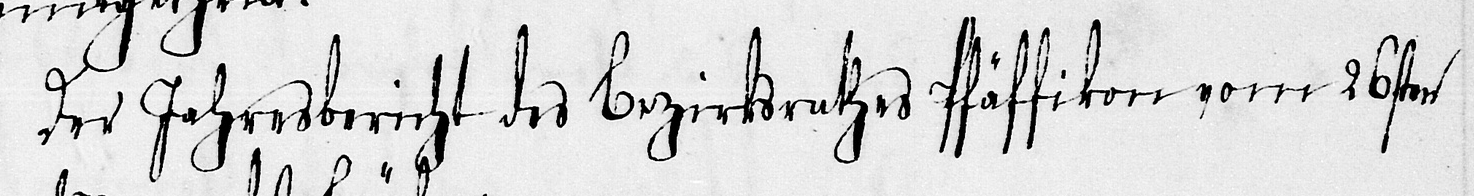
Der Jahresbericht des Bezirksrathes Pfäffikon vom 26sten
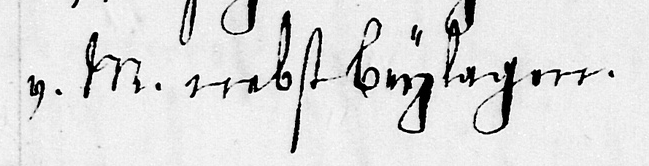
v. M. nebst Beylagen.
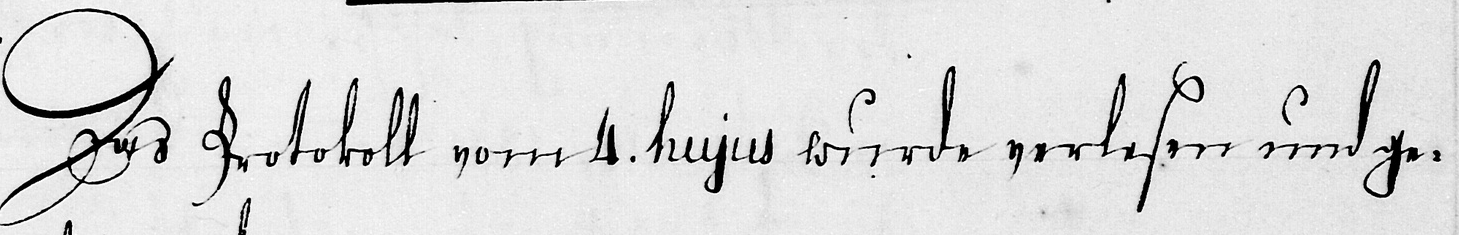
Das Protokoll vom 4. hujus wurde verlesen und ge¬
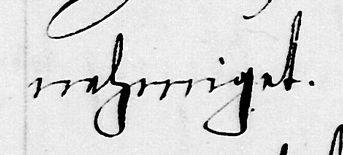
nehmiget.
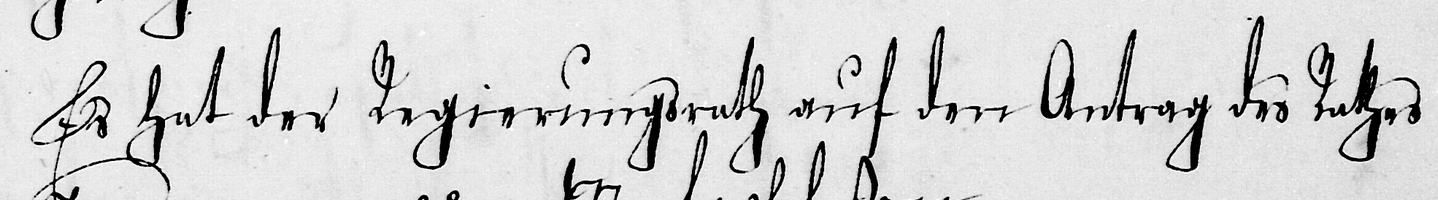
Es hat der Regierungsrath auf den Antrag des Rathes
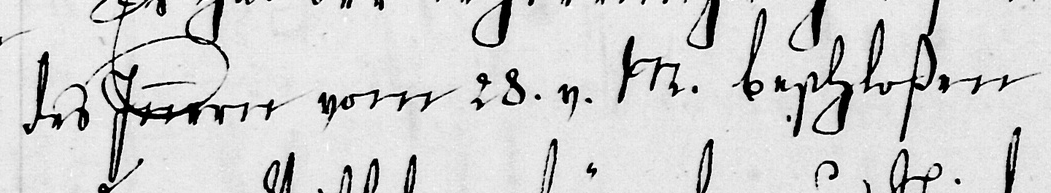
des Innern vom 28. v. M. beschloßen
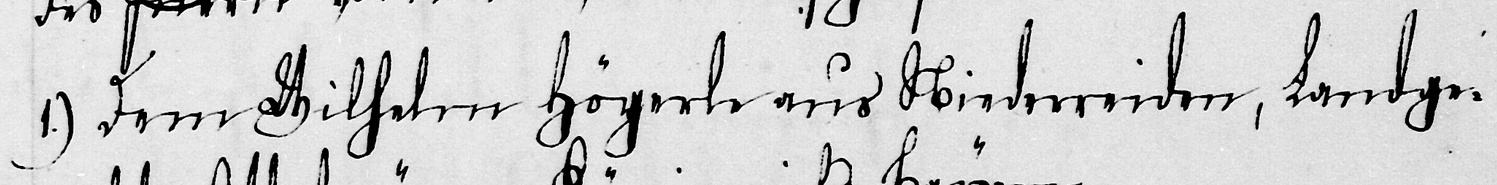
1.) Dem Wilhelm Högerle aus Niederreiden, Landge¬
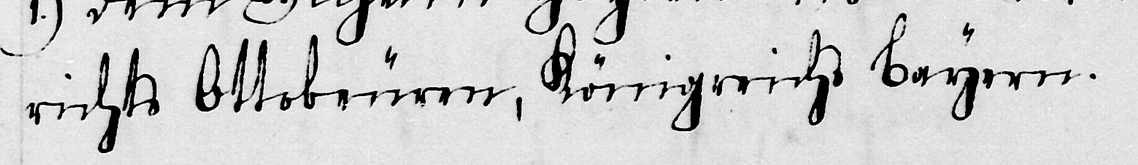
richts Ottobeuren, Königreichs Bayern.
